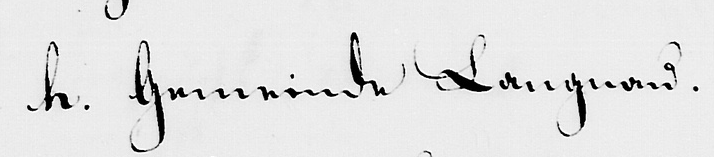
h. Gemeinde Langnau.
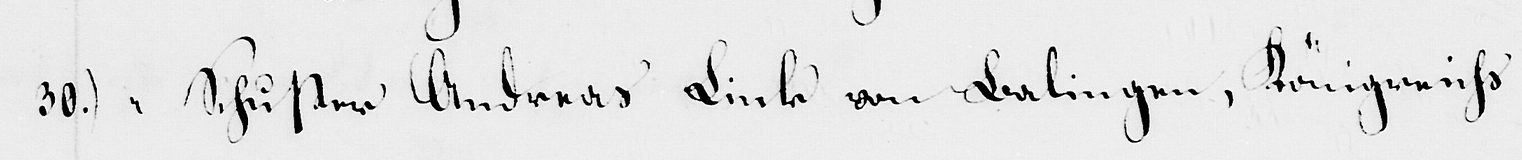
30.) " Schuster Andreas Link von Balingen, Königreichs
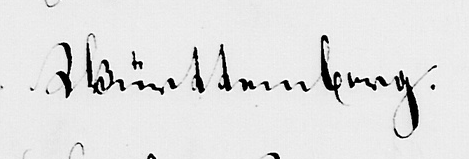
Württemberg.
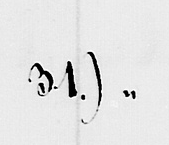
32.)
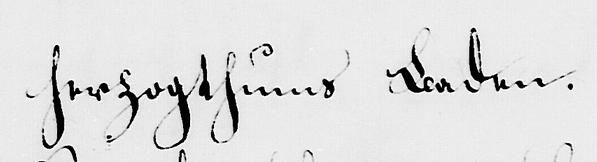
herzogthums Baden.
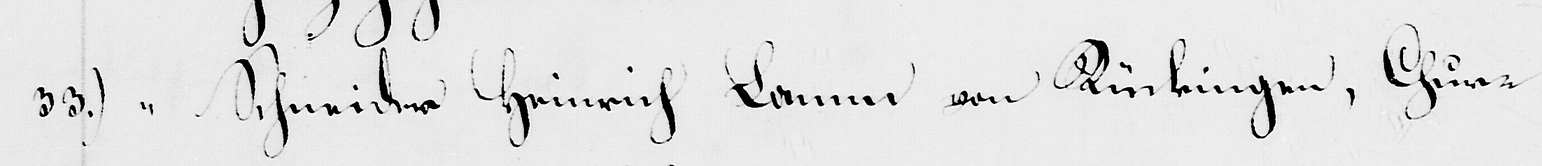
33.) " Schneider Heinrich Lamm von Rückingen, Chur¬
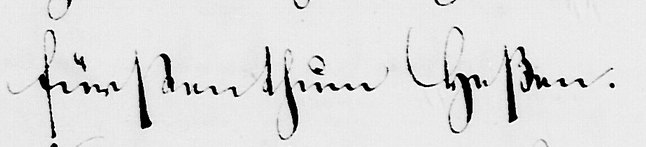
fürstenthum Heßen.
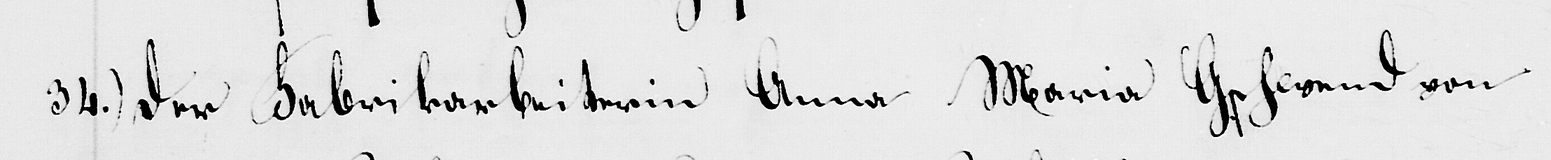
34.) der Fabrikarbeiterin Anna Maria Gschwend von
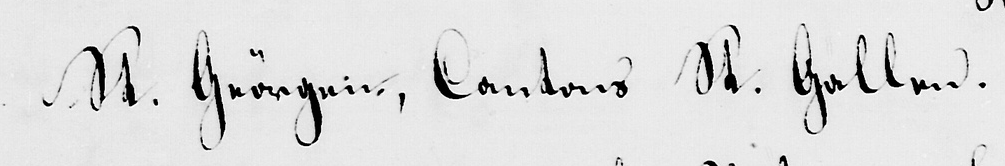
St. Geörgen, Cantons St. Gallen.
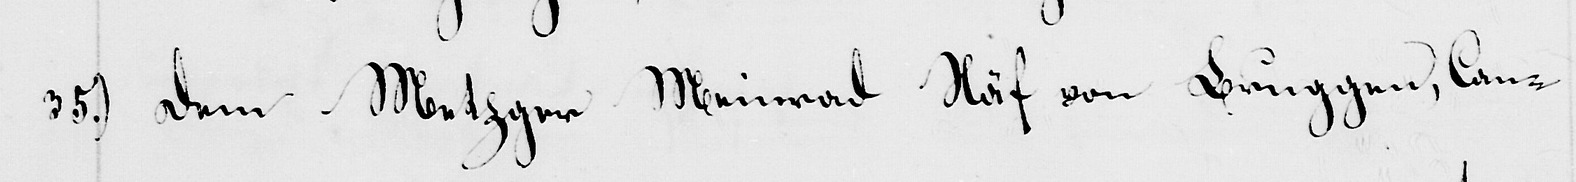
35.) dem Metzger Meinrad Näf von Bruggen, Can-
